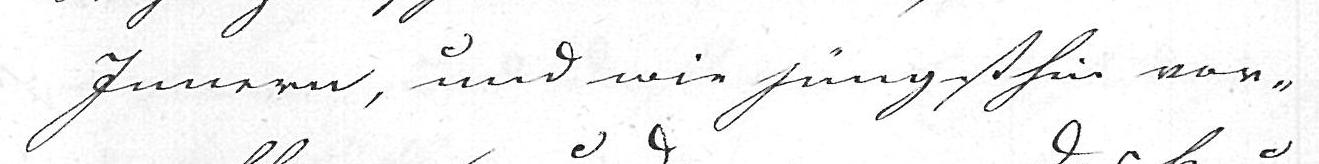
Innern, und wie jüngsthin vor-
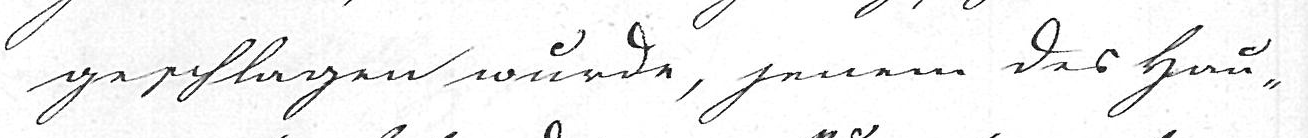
geschlagen wurde, jenem des Hau-
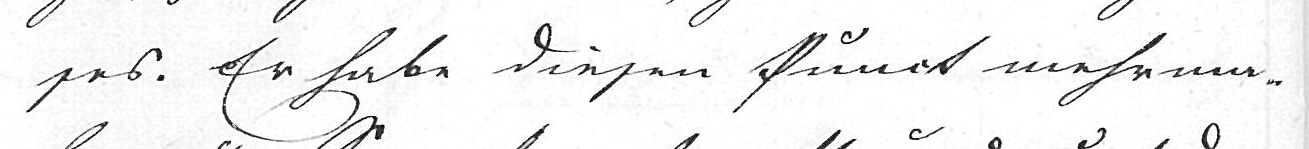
ses. Er habe diesen Puncte mehrma-
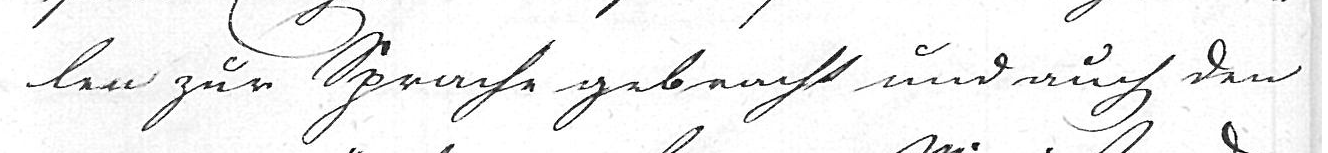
len zur Sprache gebracht und auch den
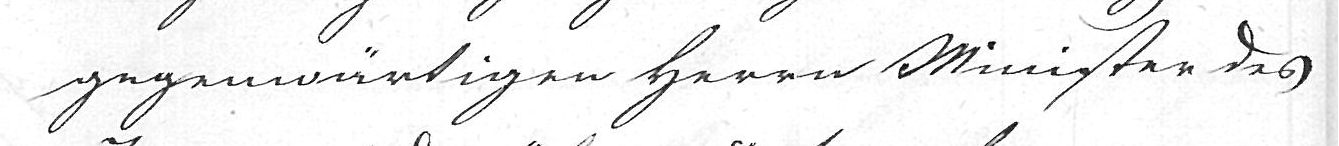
gegenwärtigen Herrn Minister des
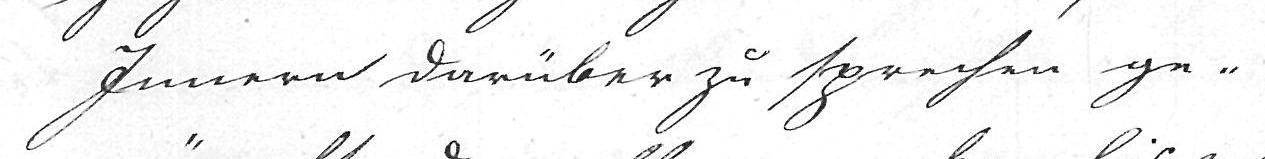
Innern darüber zu sprechen ge-
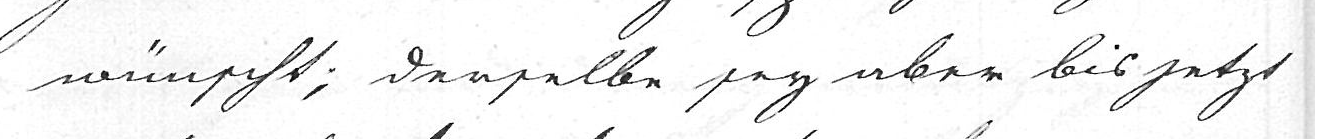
wünscht; derselbe sey aber bis jetzt
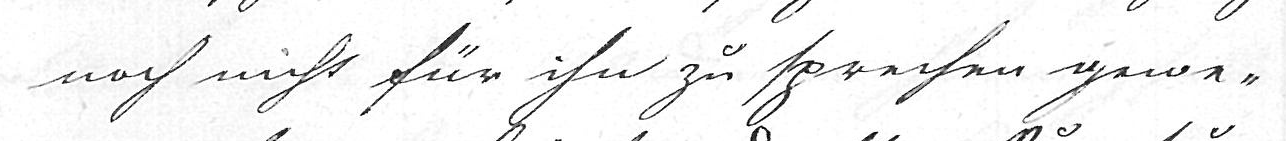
noch nicht für ihn zu sprechen gewe-
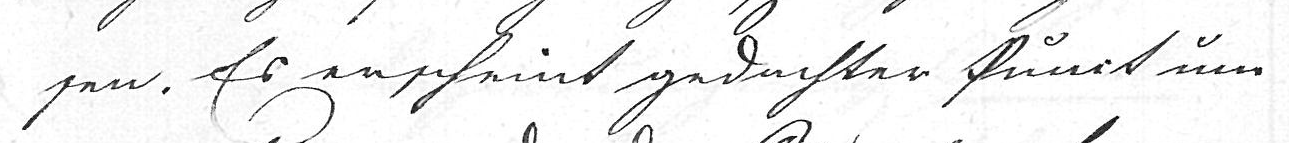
sen. Es erscheint gedachter Punct um
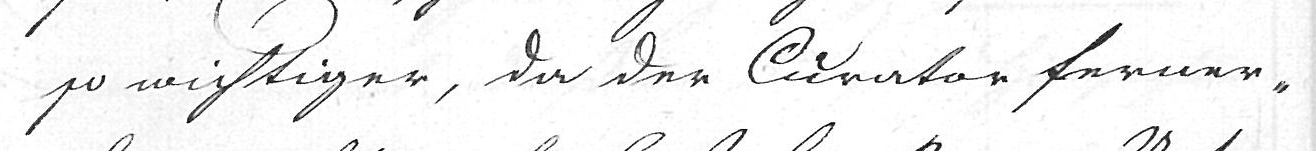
so wichtiger, da der Curator ferner-
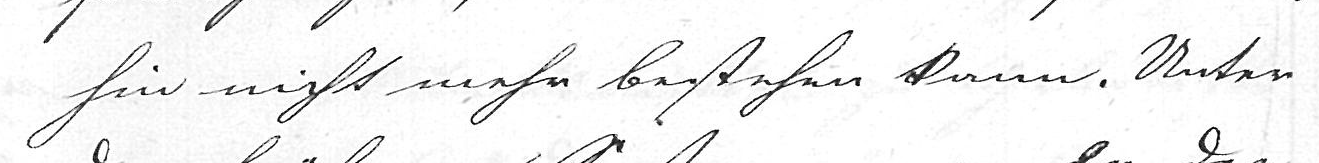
hin nicht mehr bestehen kann. Unter
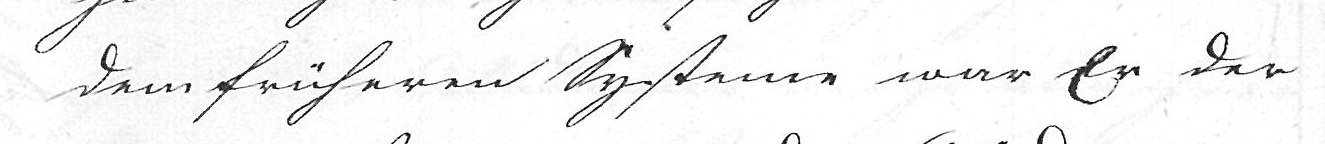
dem früheren System war Er der
